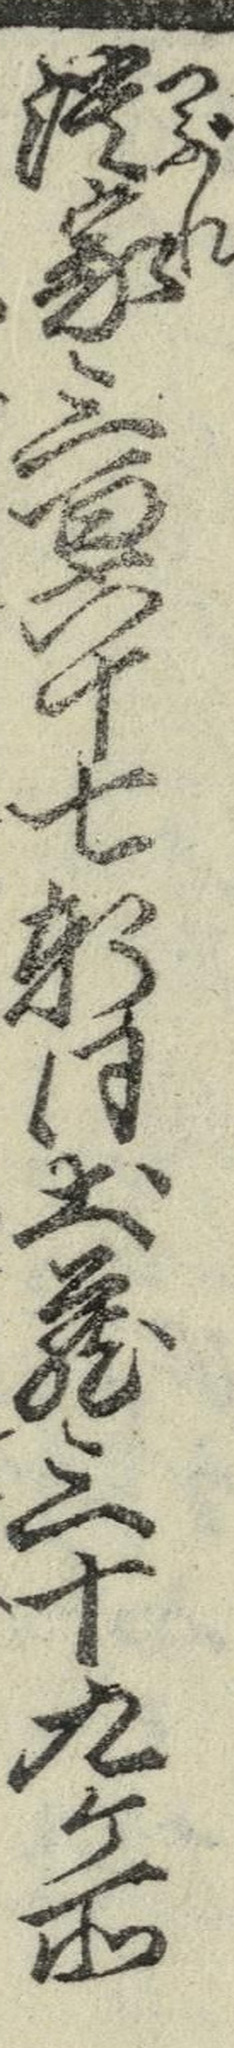潰家三百六十七軒同土蔵三十九ケ所
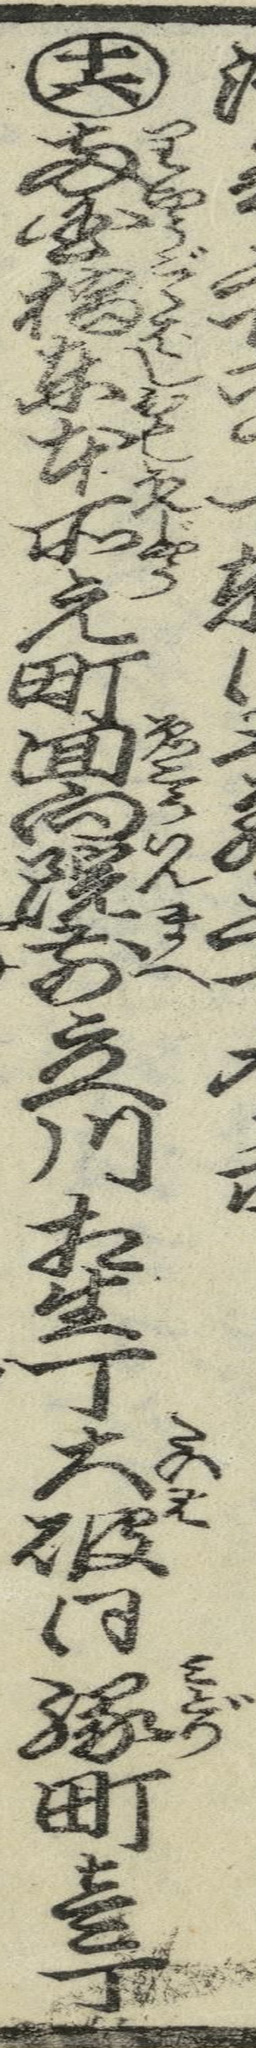十六両国橋東本所元町回向院前立川相生丁大破同緑町壱丁
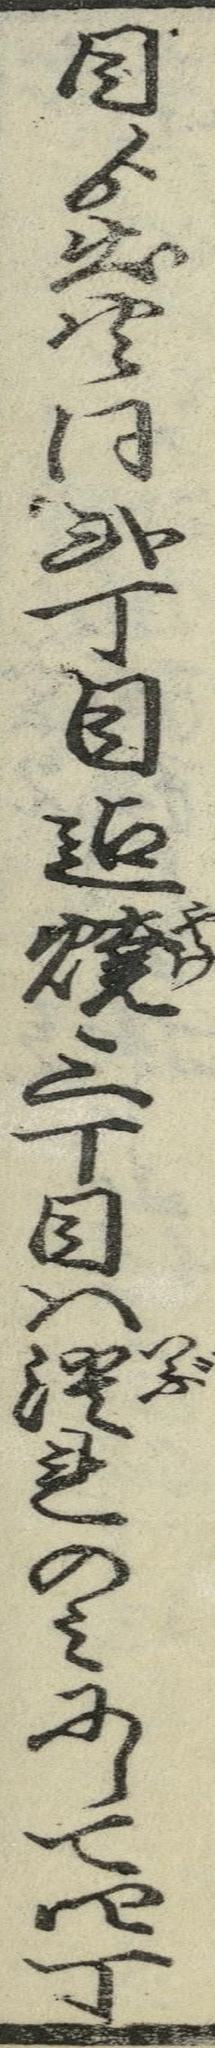目ゟ出火同弐丁目迄焼三丁目は潰れのみにして四丁
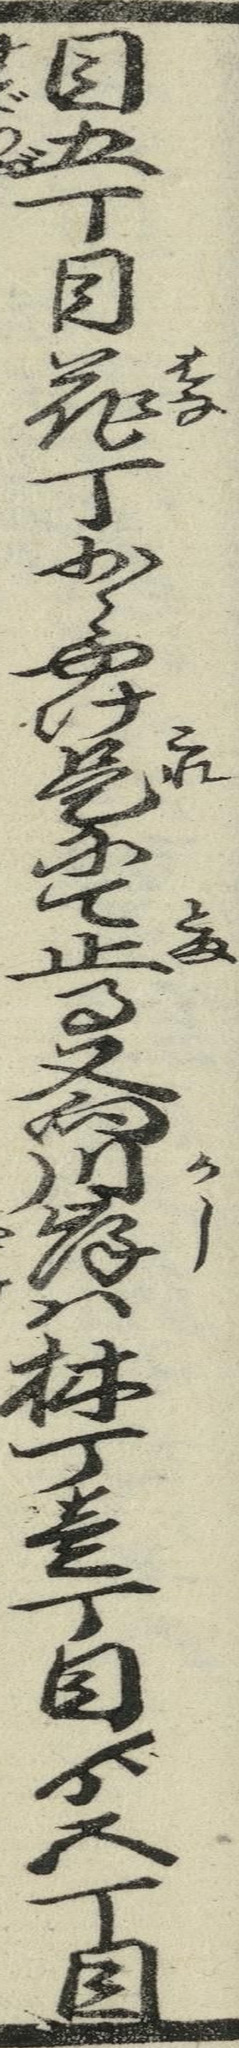目五丁目花丁少々やけ是にて止る又向川岸は林丁壱丁目ゟ五丁目
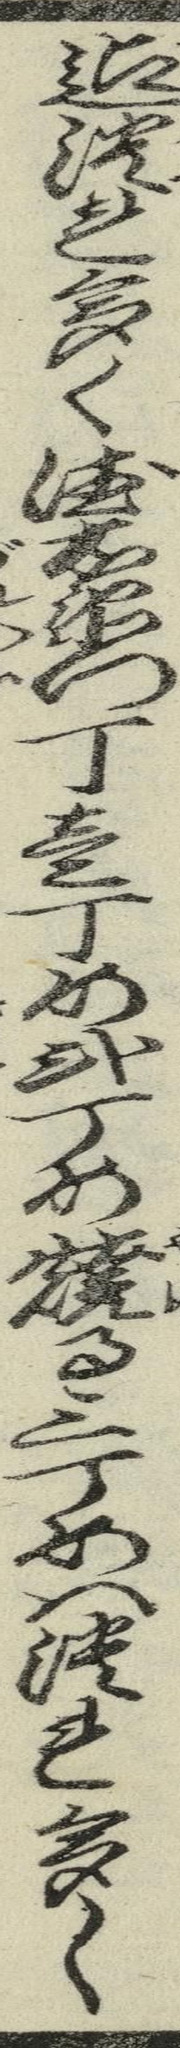迄潰れ多く徳右衛門丁壱丁め弐丁め焼る三丁めは潰れ多く
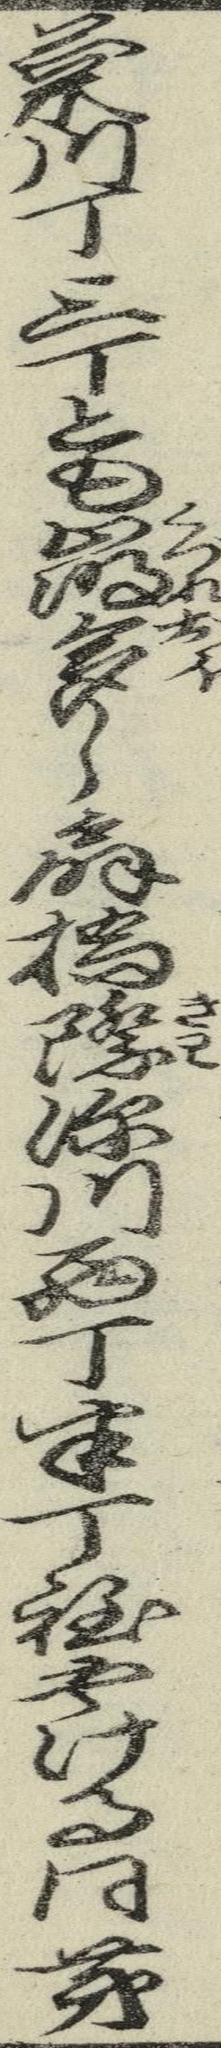菊川丁三丁とも崩多し扇橋際深川西丁半丁程やける同茅
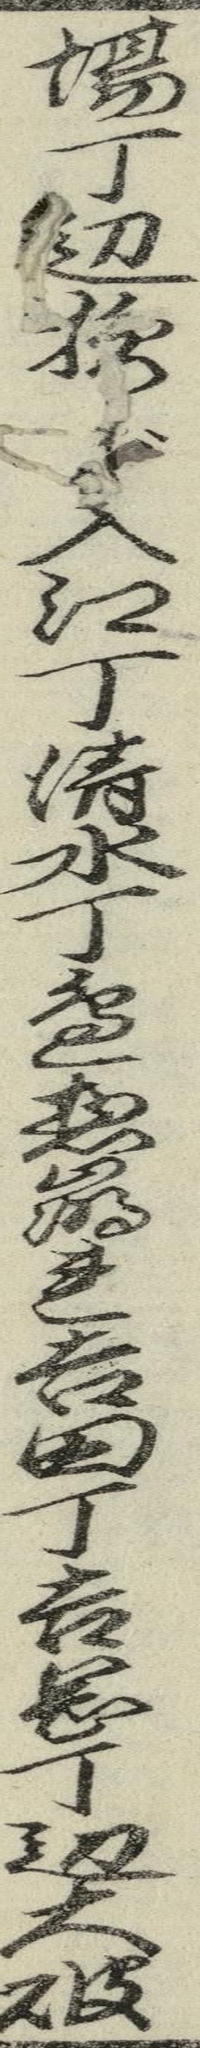場丁辺損ず入江丁清水丁辺惣崩れ吉田丁吉岡丁辺大破
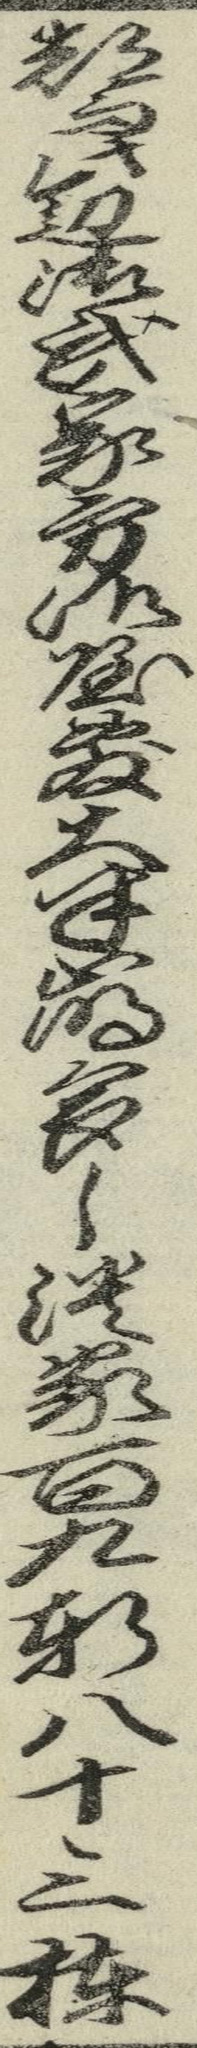都而此辺御武家方御屋敷大半崩多し潰家百九軒八十三棟
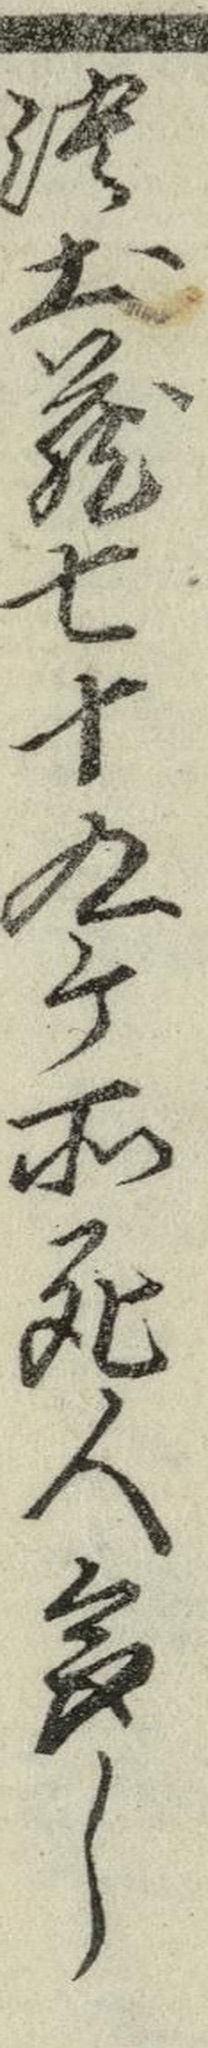潰土蔵七十九ケ所死人多し
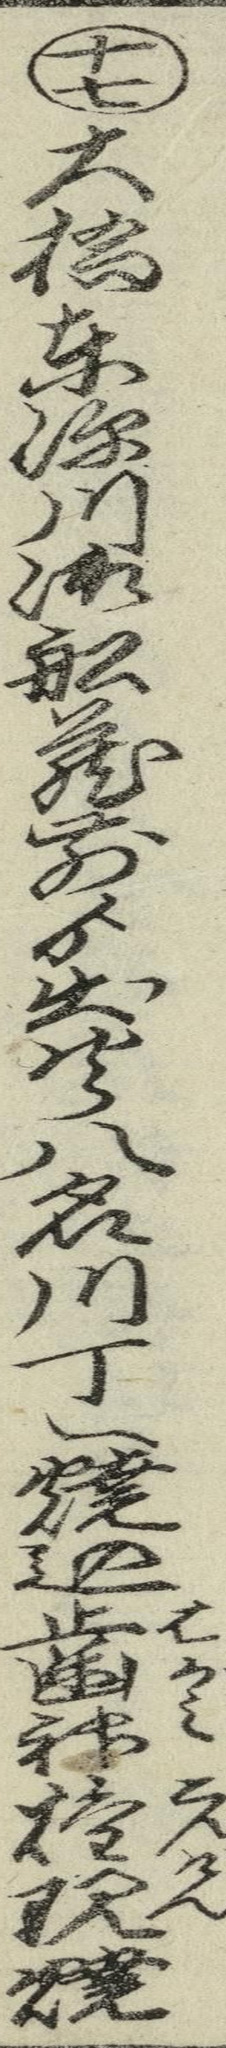十七大橋東深川御船蔵前ゟ出火八名川丁へ焼辺歯神権現焼
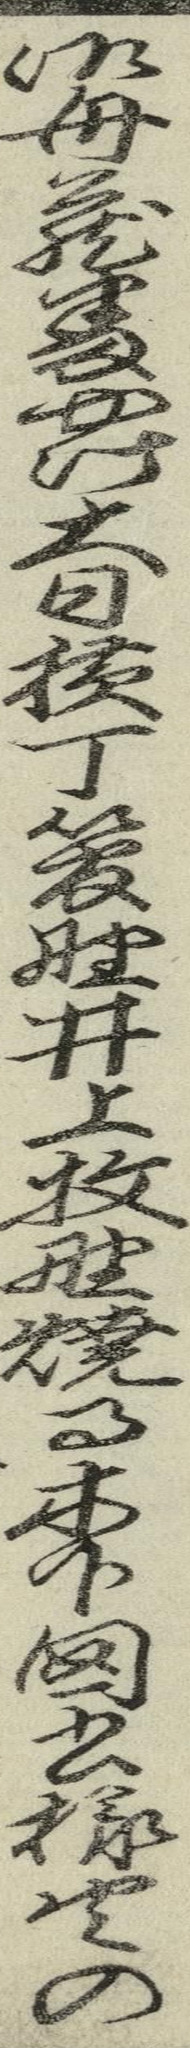御舟蔵番やけ大日横丁菅野井上牧野焼る木下図書様火の
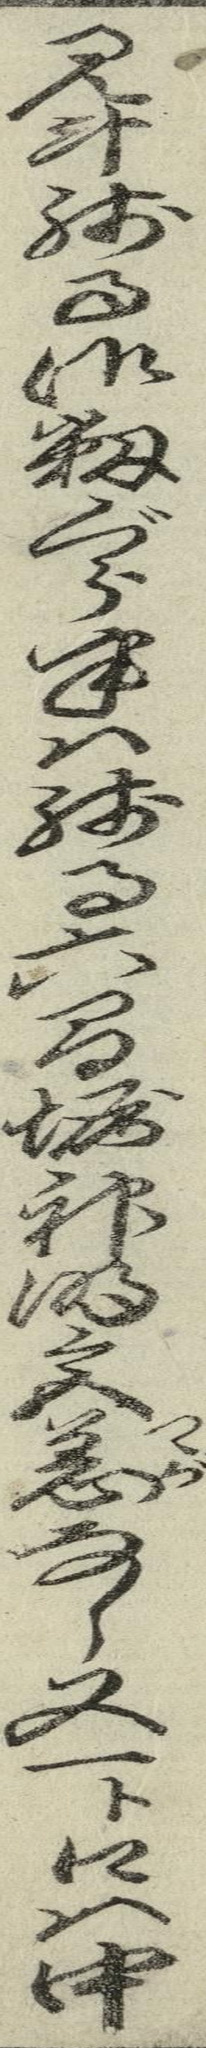見斗残る御籾ぐら半は残る六間堀神明宮恙なし又一ト口は中
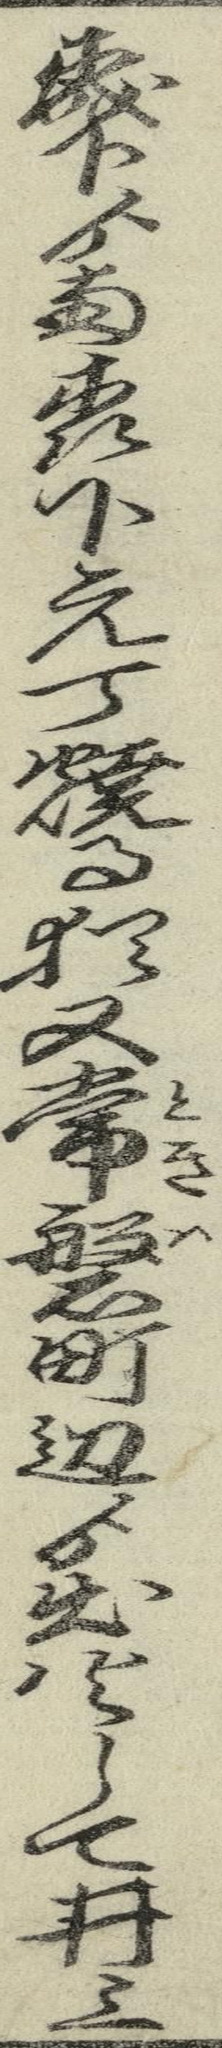森下ゟ南森下元丁焼る猶又常磐町辺ゟ出火して井上
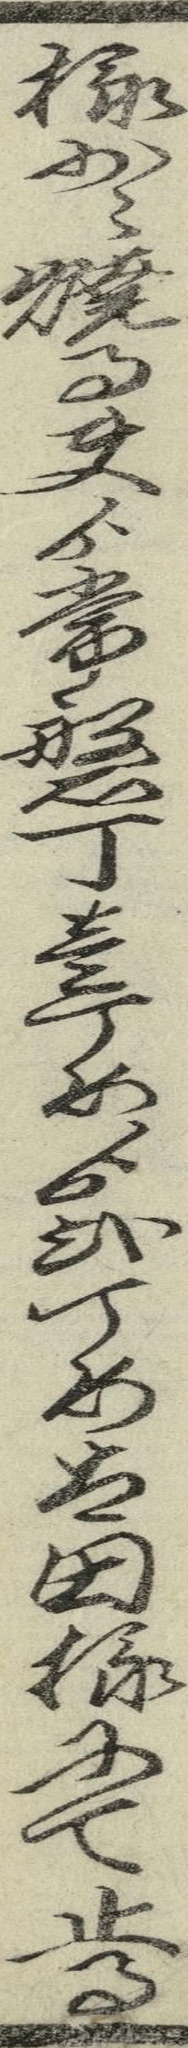様少々焼る夫ゟ常磐丁壱丁めゟ弐丁め古田様にて止る

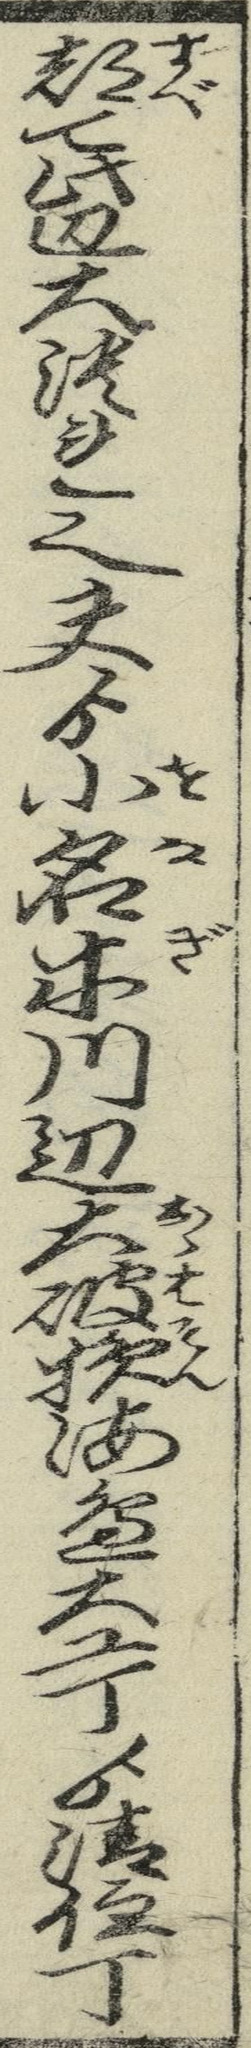都て此辺大潰れ也夫ゟ小名木川辺大破損海辺大工丁ゟ清住丁
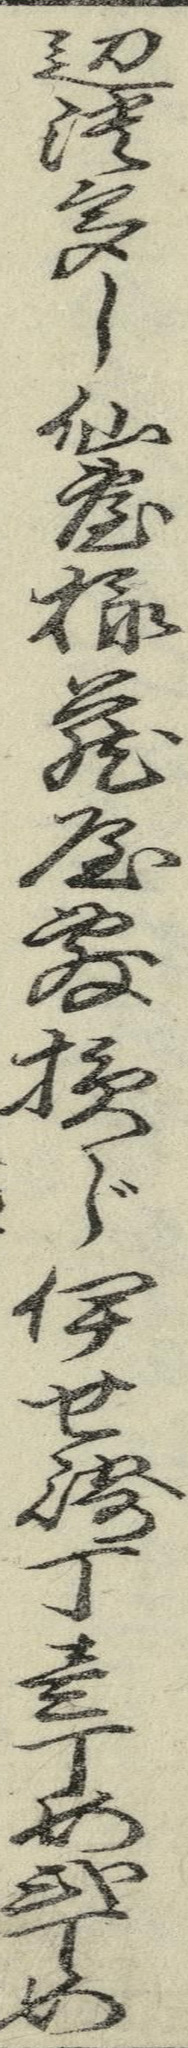辺潰多し仙台様蔵屋敷損じ伊せ崎丁壱丁め弐丁め
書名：地震年代記
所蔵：東京大学地震研究所図書室 Earthquake Research Institute Library, The University of Tokyo, JAPAN
